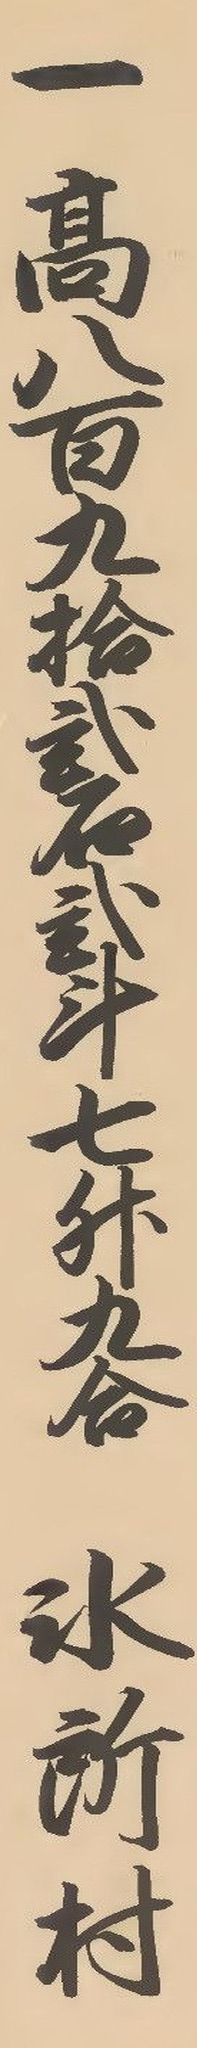一高八百九拾弐石弐斗七升九合氷所村
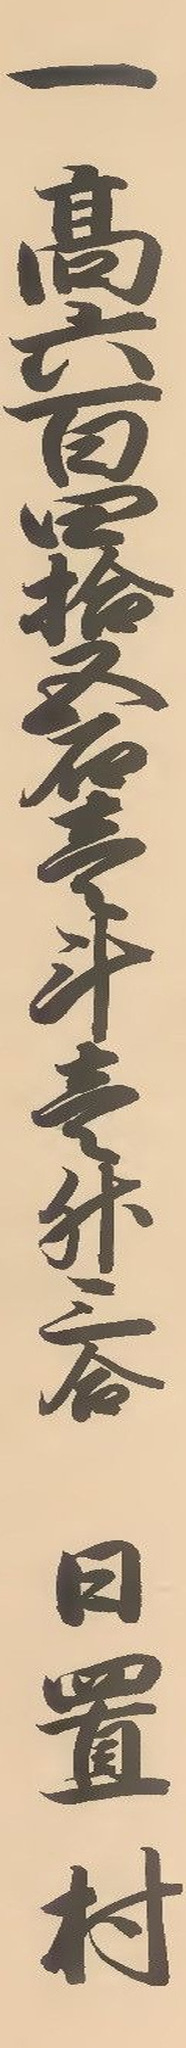一高六百四拾五石壱斗壱升三合日置村
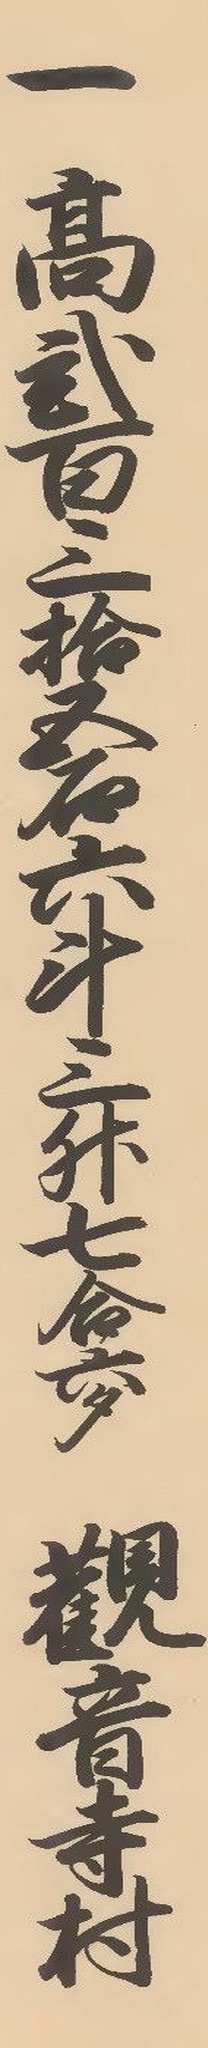一高弐百三拾五石六斗三升七合六勺観音寺村
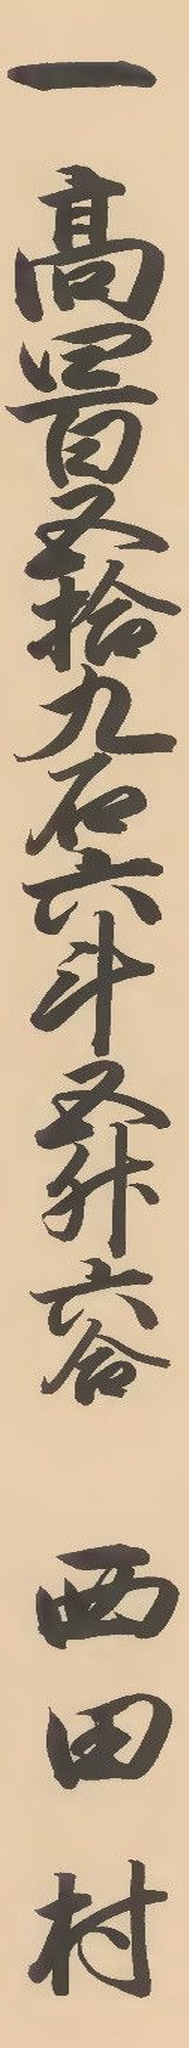一高四百五拾九石六斗五升六合西田村
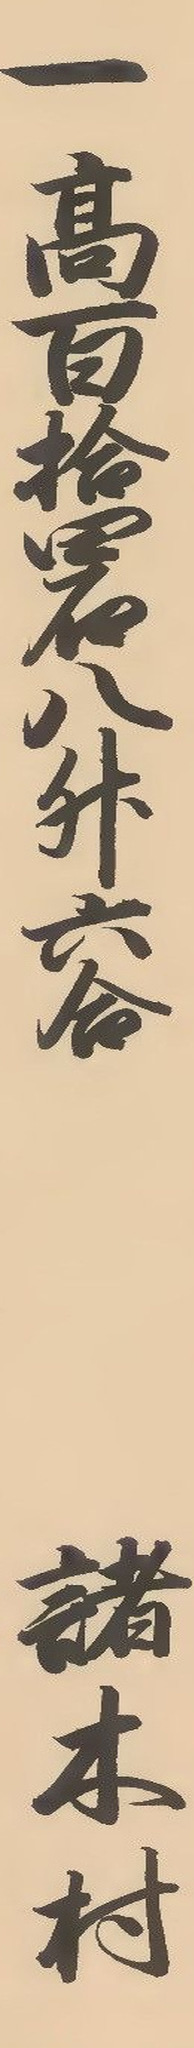一高百拾四石八升六合諸木村

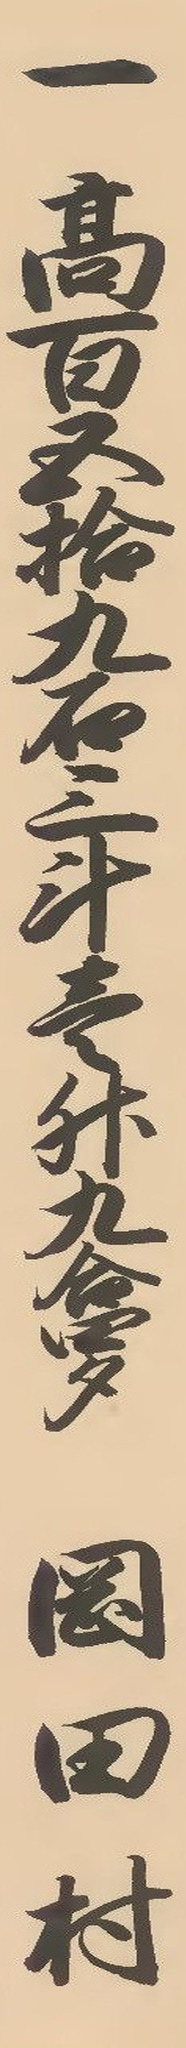一高百五拾九石三斗壱升九合四勺岡田村
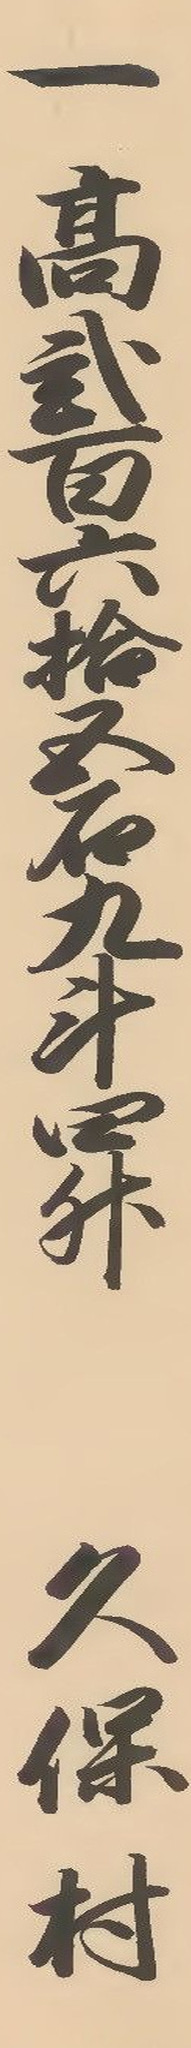一高弐百六拾五石九斗四升久保村
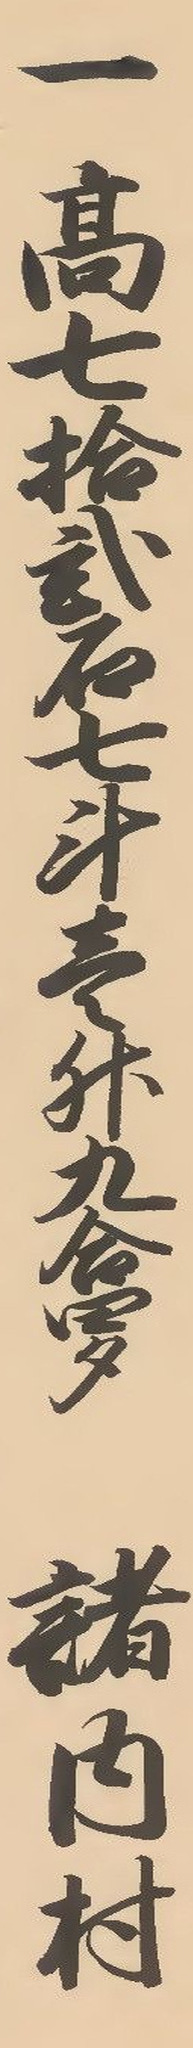一高七拾弐石七斗壱升九合四勺諸内村
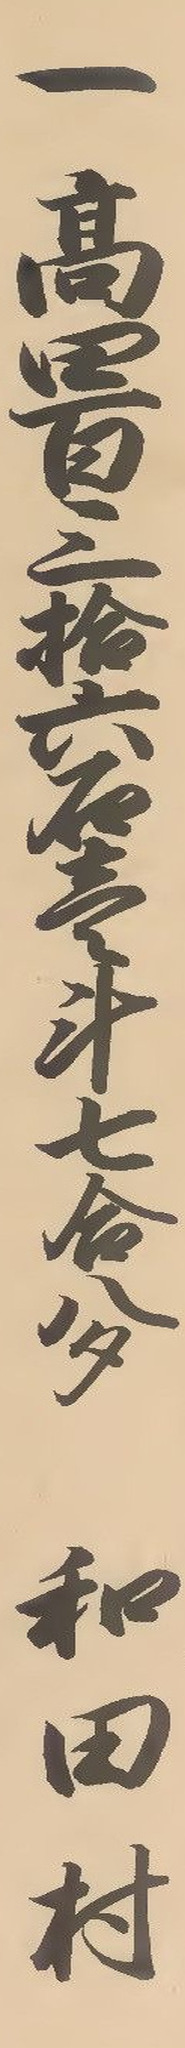一高四百三拾六石壱斗七合八勺和田村
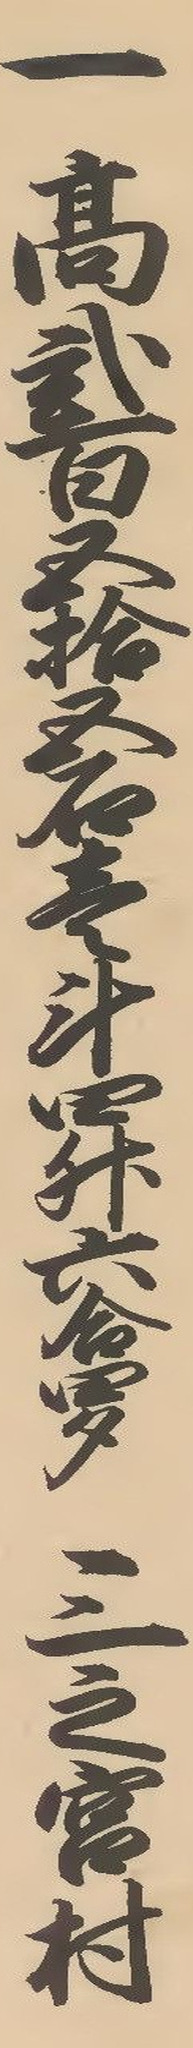一高弐百五拾五石壱斗四升六合四勺三之宮村
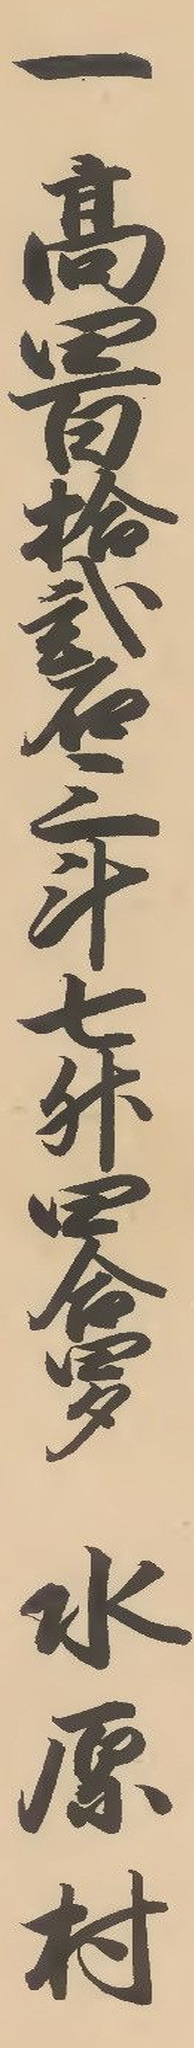一高四百拾弐石三斗七升四合四勺水原村
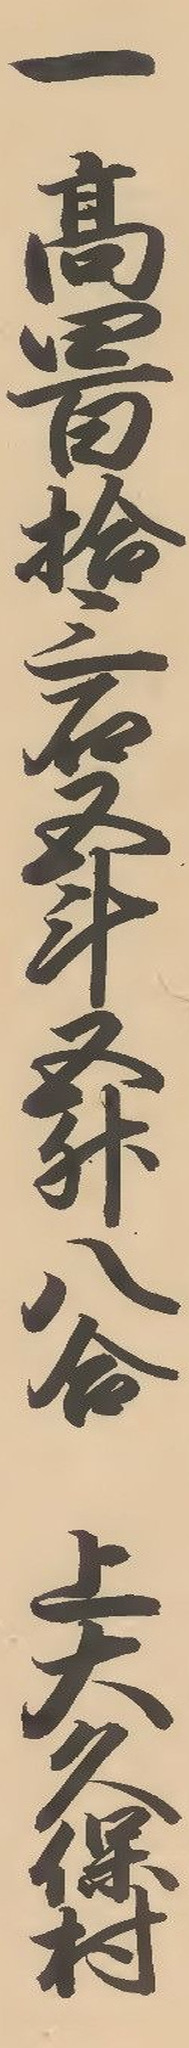一高四百拾三石五斗五升八合上大久保村

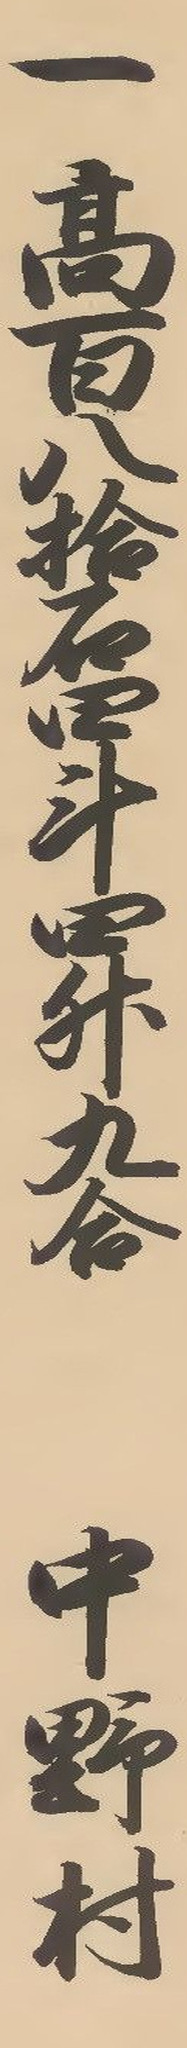一高百八拾石四斗四升九合中野村
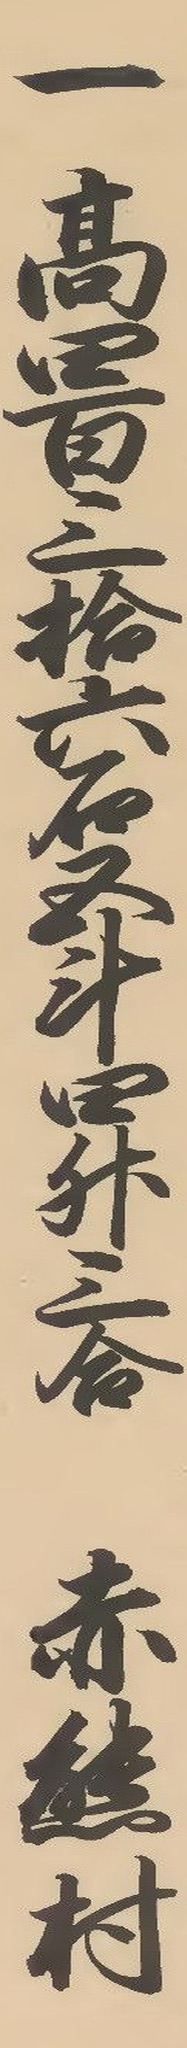一高四百三拾六石五斗四升三合赤熊村
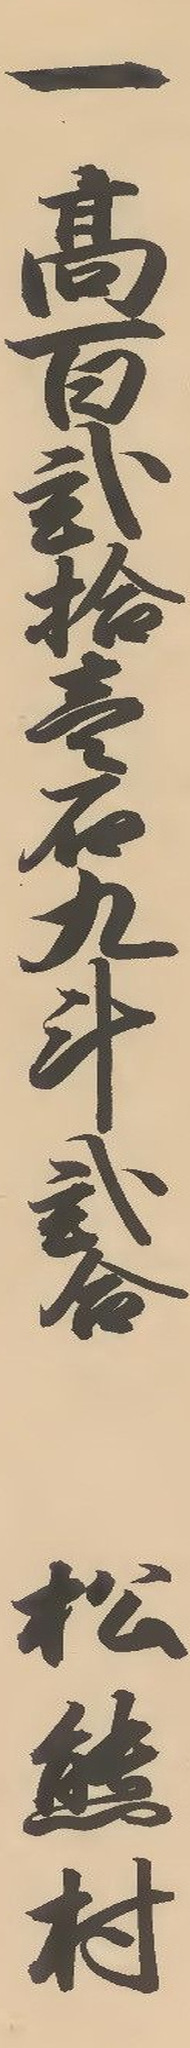一高百弐拾壱石九斗弐合松熊村
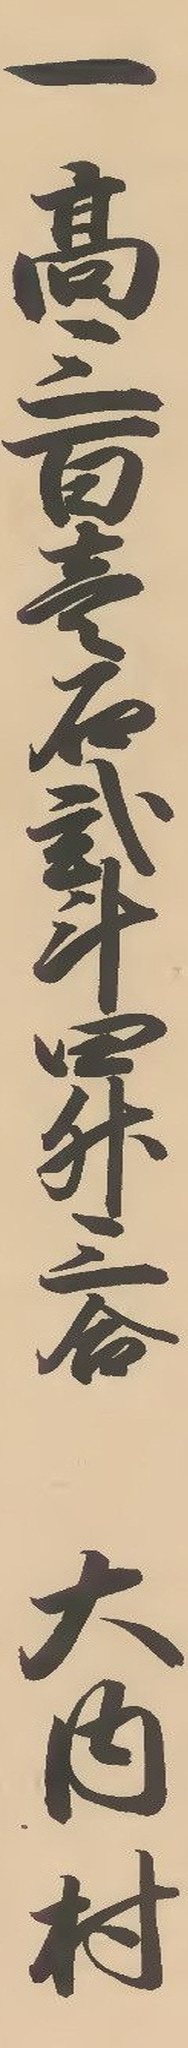一高三百壱石弐斗四升三合大内村
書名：丹波国郷帳
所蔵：国立公文書館 National Archives of Japan
